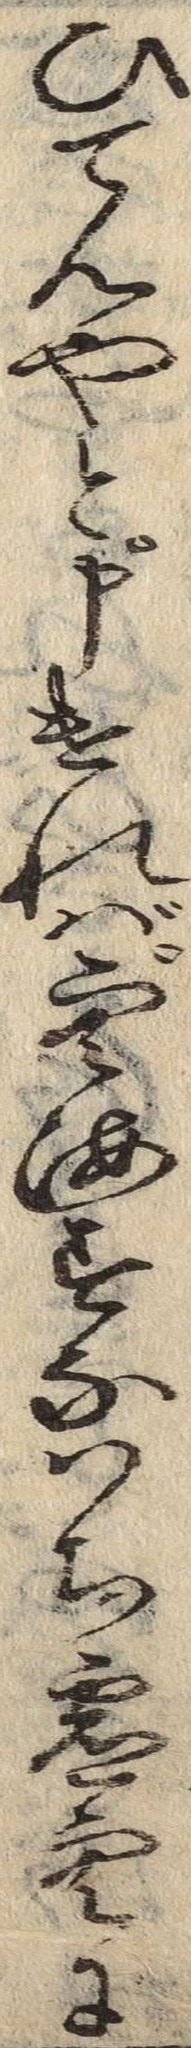ひてんやと。申ければ。空海すなはち虚空に
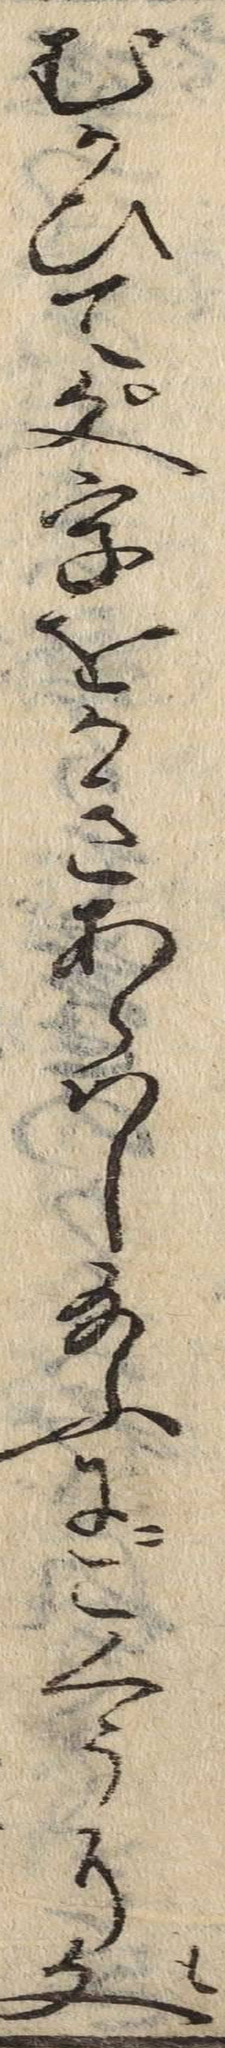むかひて。文字をかきあらはし給ふに。こくうに文
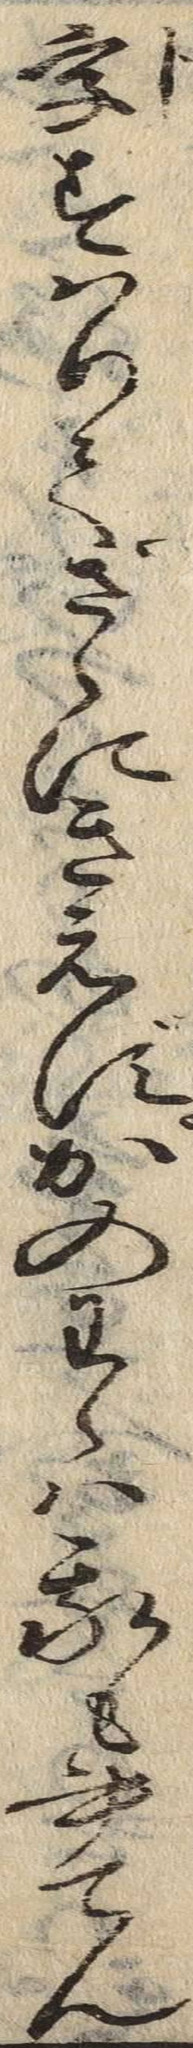字をはりて。さらにきえず。かのわらは我も書てん
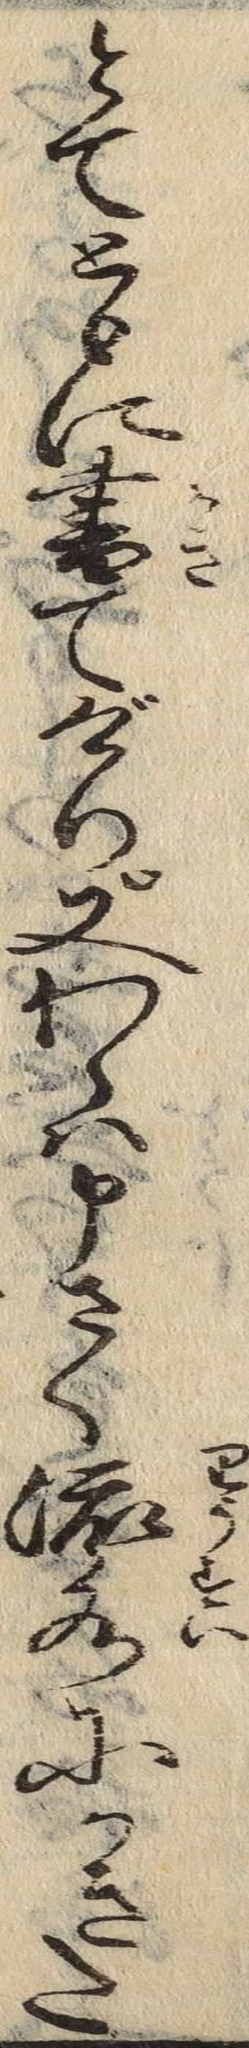とてともに書てげり。又わらは申さく流水にかきた
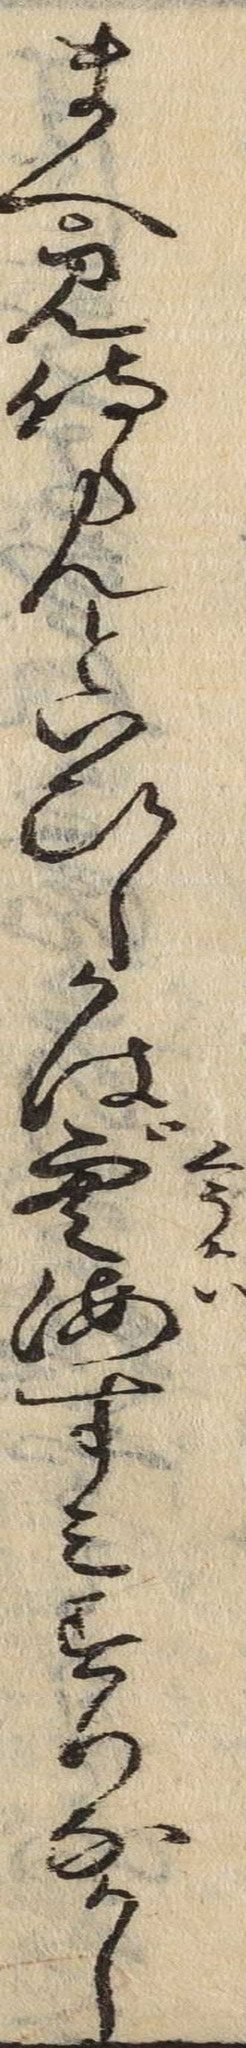まへ。見侍らんといひしかは。空海すみすりなかし
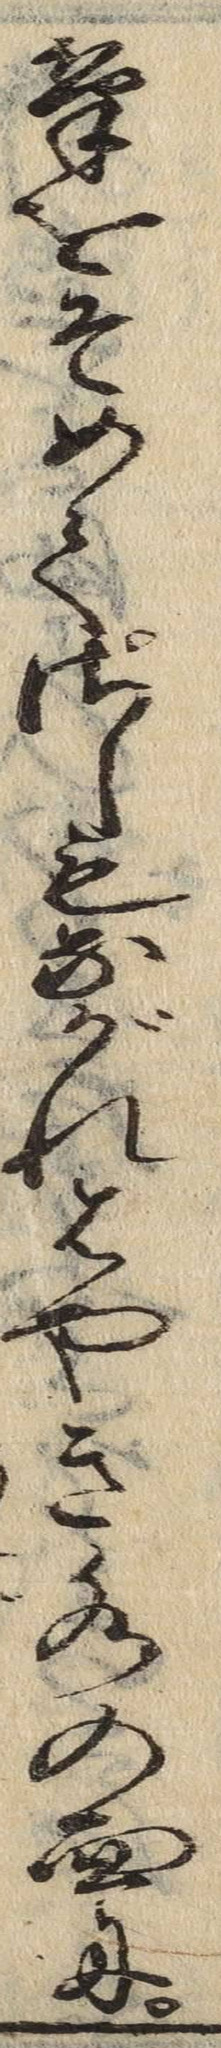筆をそめて。さしもながれはやき水の面に。
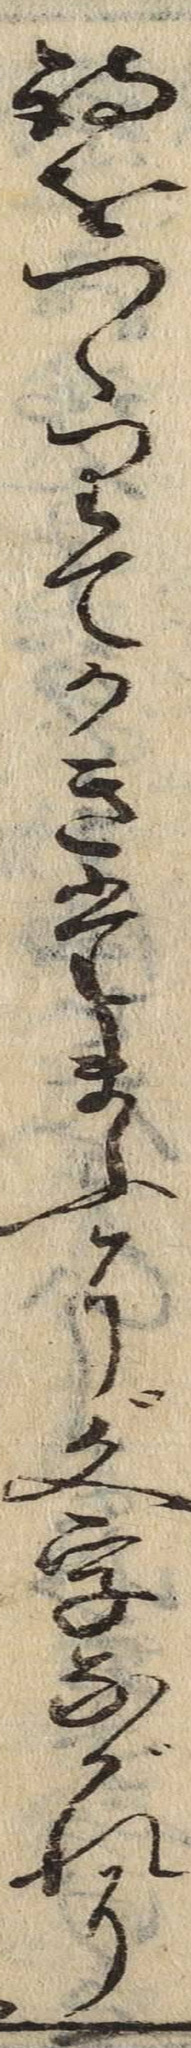詩をつくりてかき出たまふに。文字ながれに
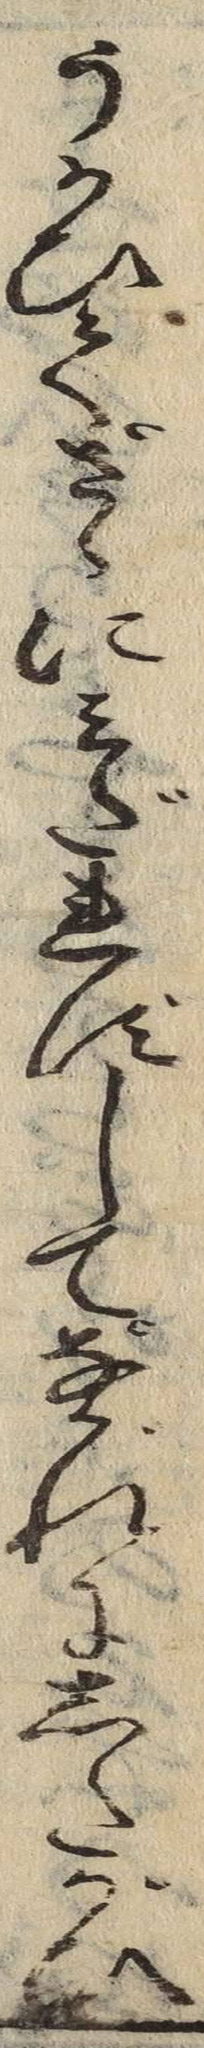うかひて。さらにみだれずして。ながれにしたがひ
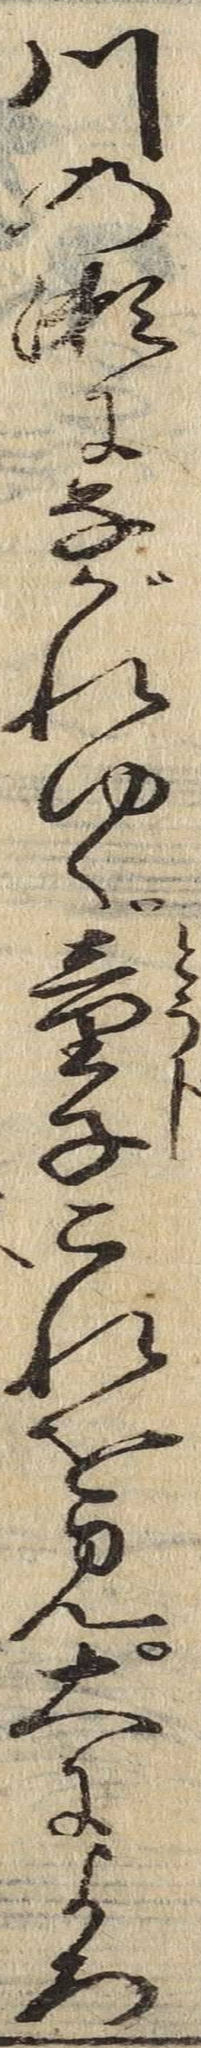川の瀬に流れゆく。童子これを見大によろ
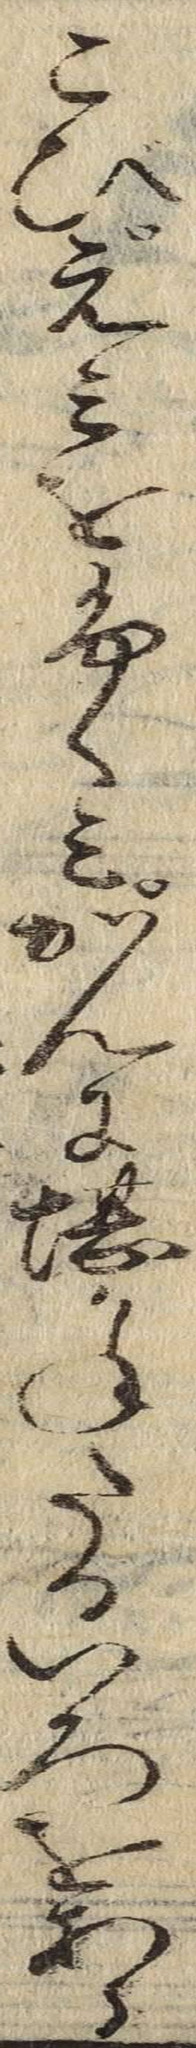こび。えみをふくみ。かんに堪かねたるいろをあら
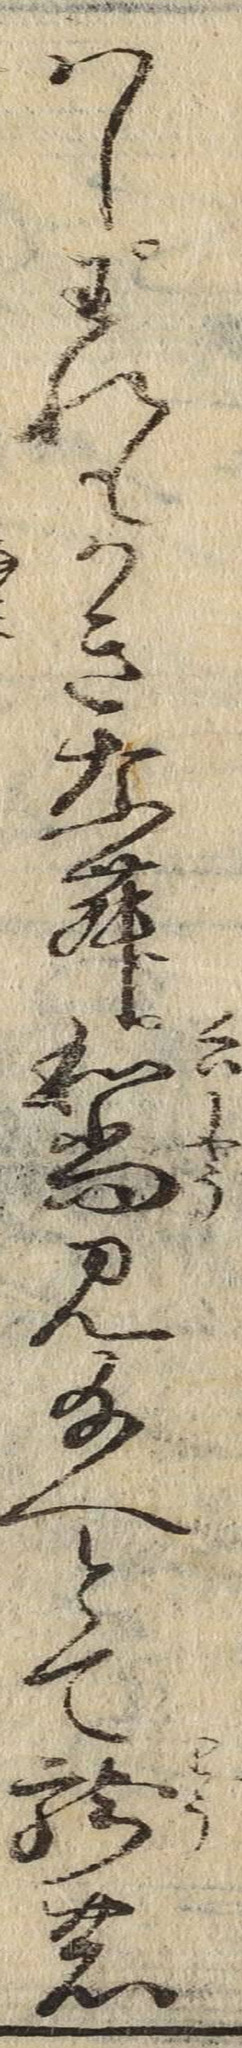はし。われもかきなむ。和尚見給へとて龍の
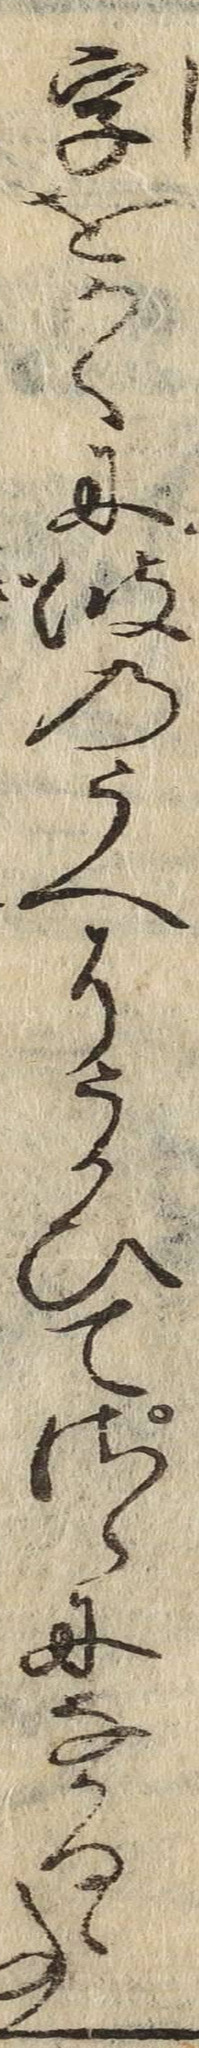字をかくに波のうへにうかひて。さらになかるゝ事
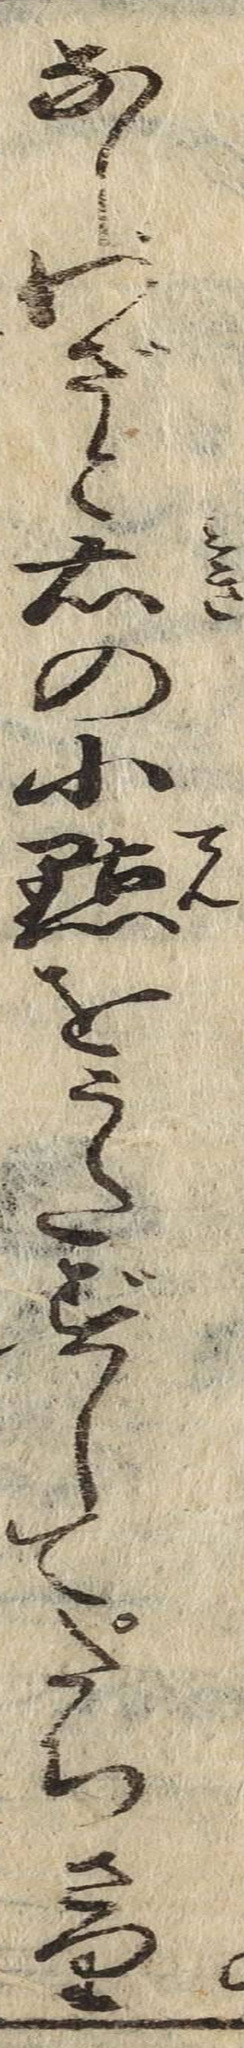なし。わざと右の小点をうたずして。たちさり
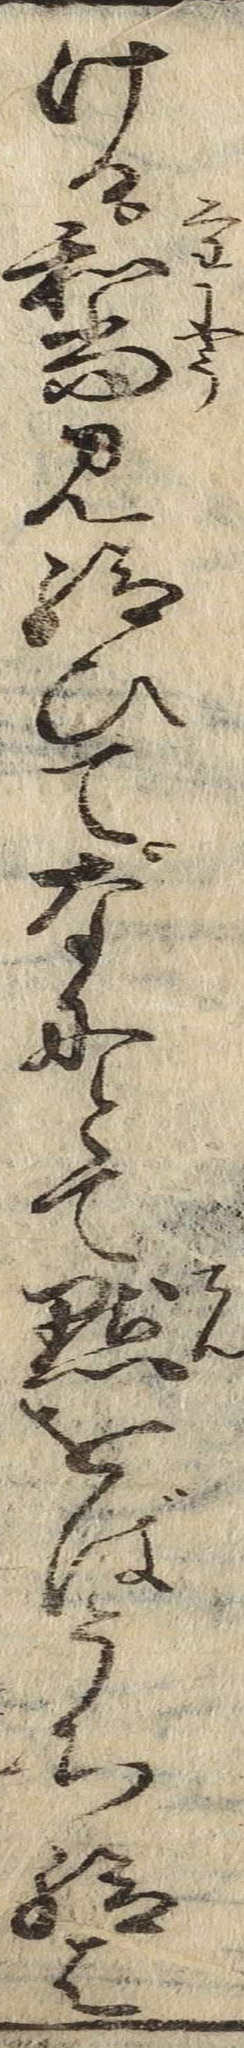ける。和尚見給ひて。なにとて点をばうち給は
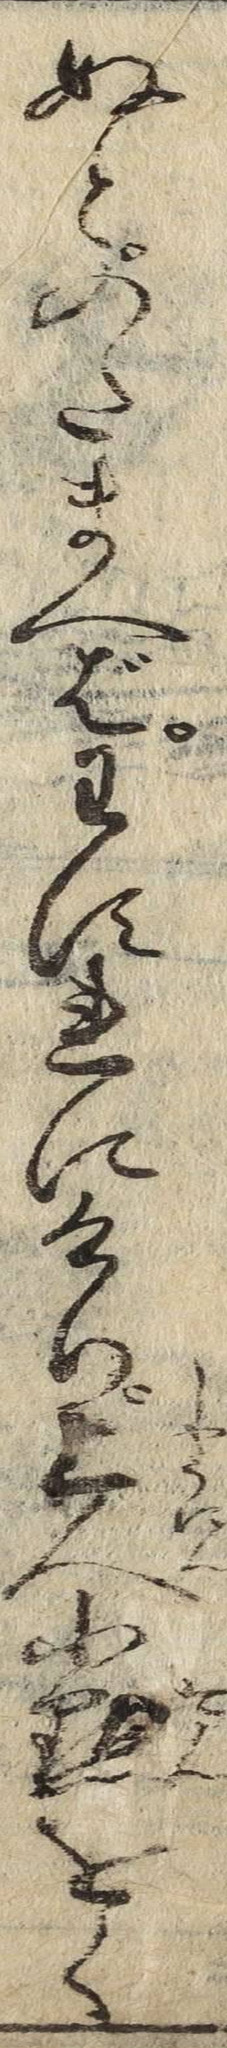ぬと。のたまへば。わすれにけり。上人に点をく
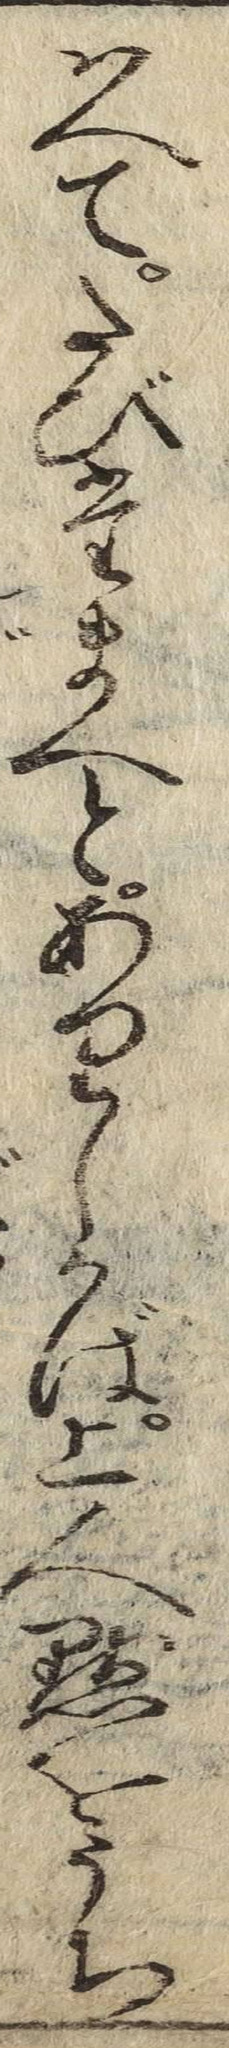はへて。たびたまへと。ありしかば。上人点をうち
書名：弘法大師御傳記
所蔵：京都府立京都学・歴彩館 国文学研究資料館
